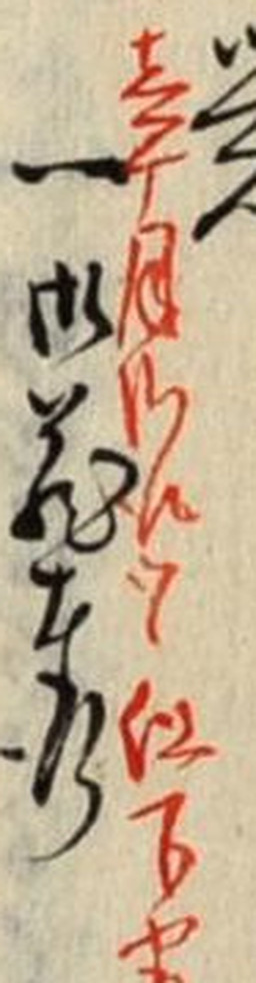一川除奉行
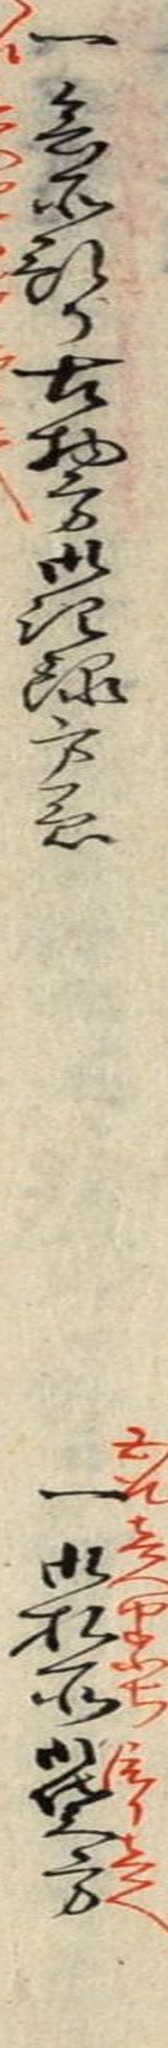一念所預り古物方御記録方兼一御札所御貸方
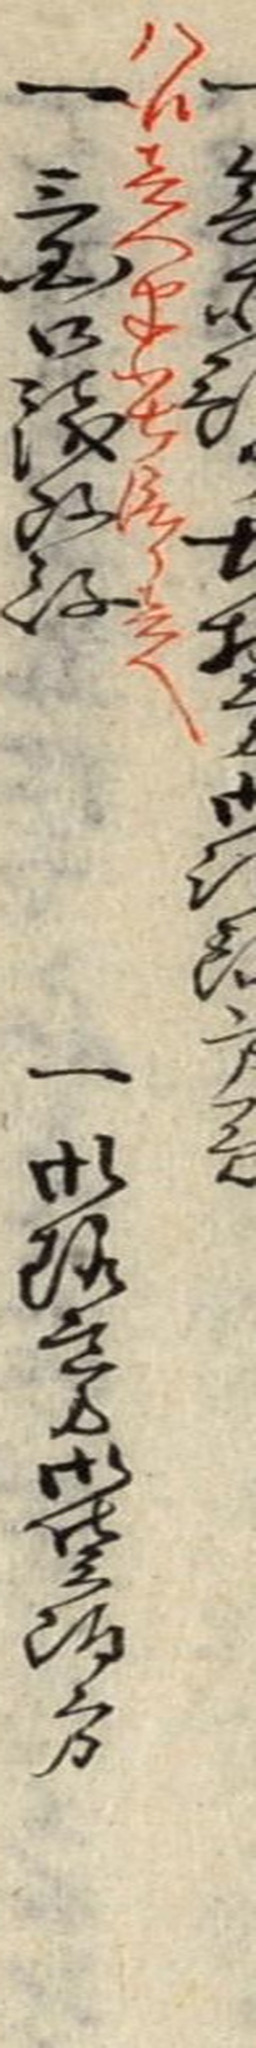一三国口銭改役一御趣意方御貸附方
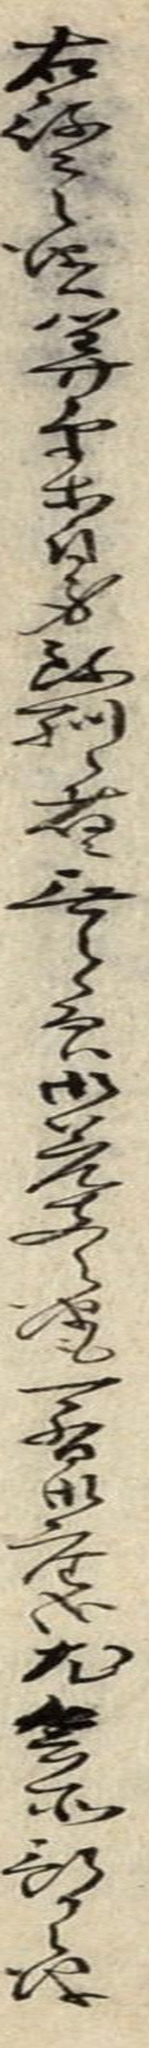右役々之儀は算筆等自身致馴候者に無之候而は御差支之儀も可有御座哉尤念所預り之儀
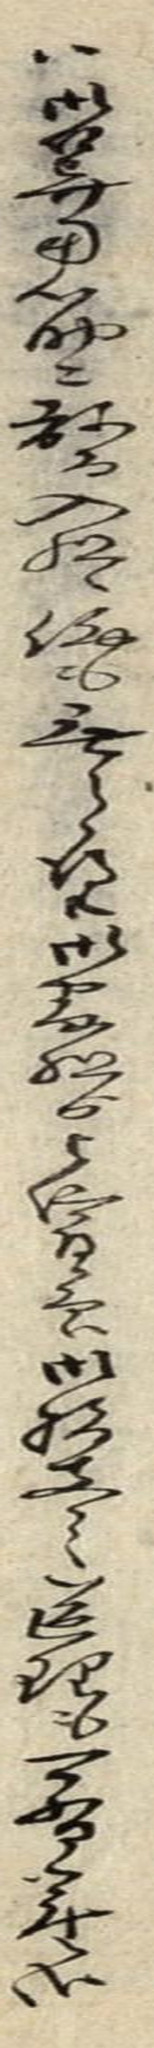は御算用筋に敢而入組候儀も無之候得共御番組ゟ被仰付候而は御指支之道理も可有御座候哉
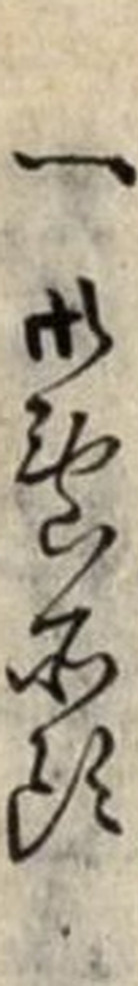一御台所頭
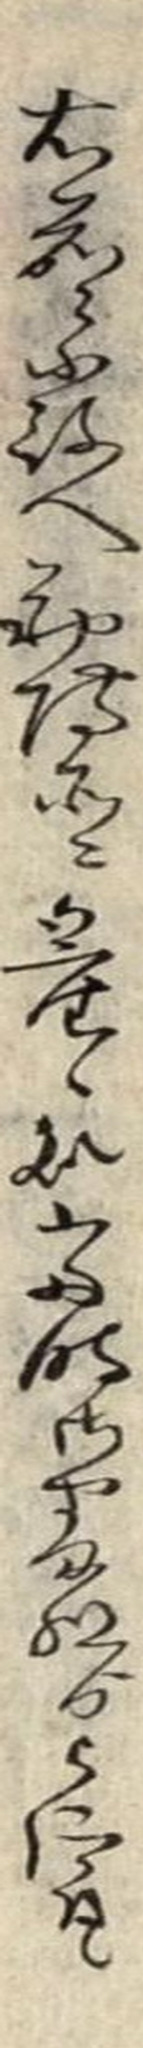右前々小役人勤場所に御座候処当時御番組ゟ被仰付候
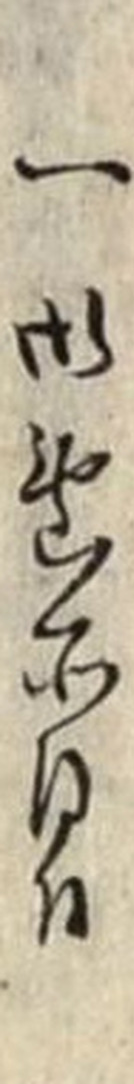一御台所頭
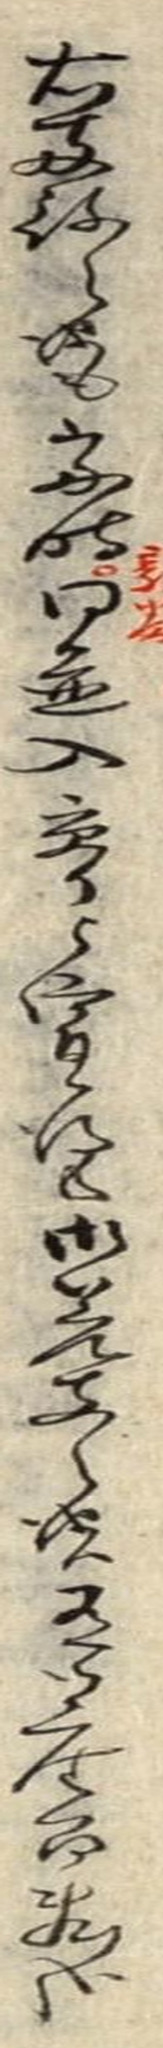右両役之儀も当時◦新番落か同並入交り被仰付候得共御差支之儀は有御座間敷哉
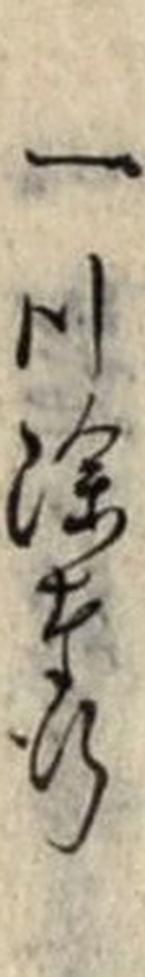一川除奉行
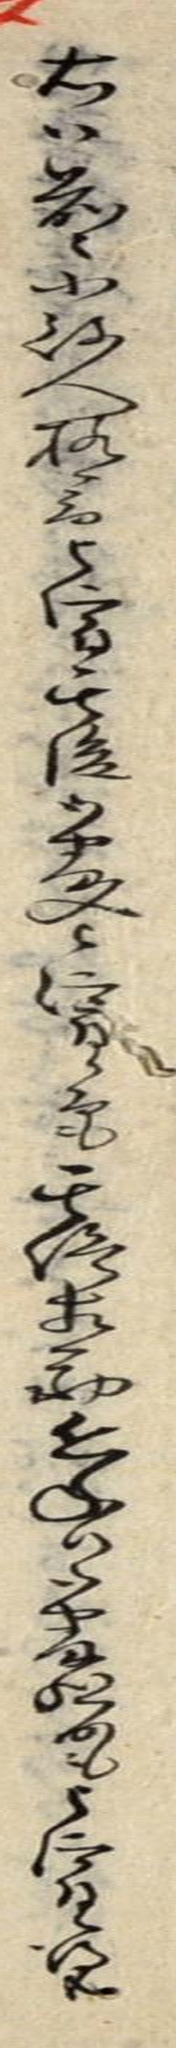右は前々小役人格に而被仰付其後御番入被仰付候而も其侭相勤近年は御番組ゟも被仰付候得共

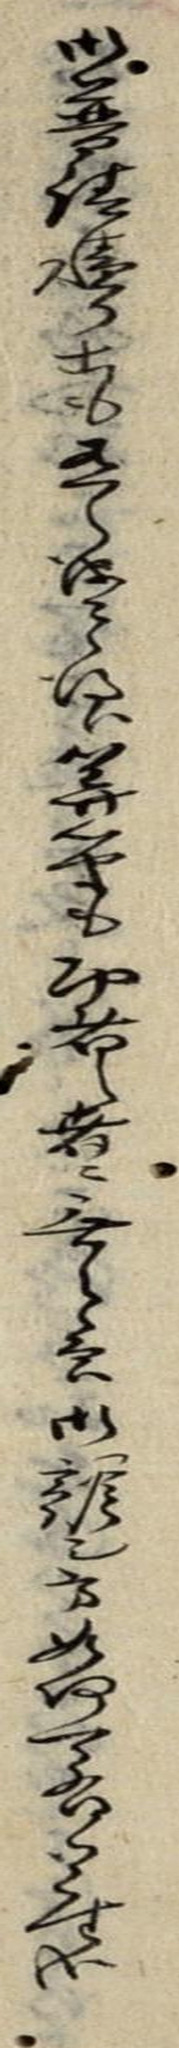御普請積り等も有之儀に候得は算筆も功者之者に無之候而は御弁シ方如何可有御座哉
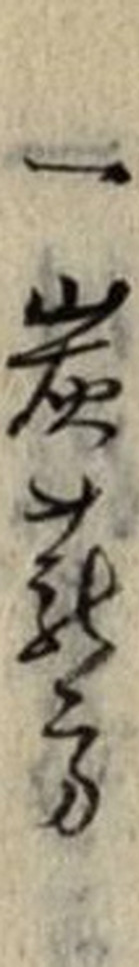一炭薪方
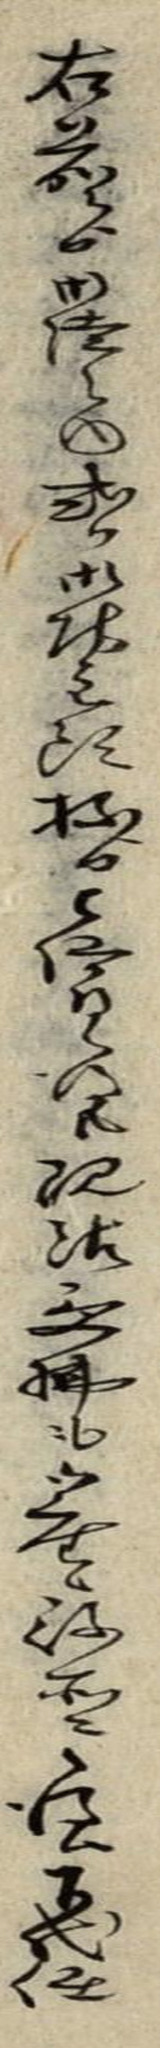右前々ゟ御徒之内或は御坊主頭抔ゟ被仰付候得共現銀受払も御座候役所に候得は下代任
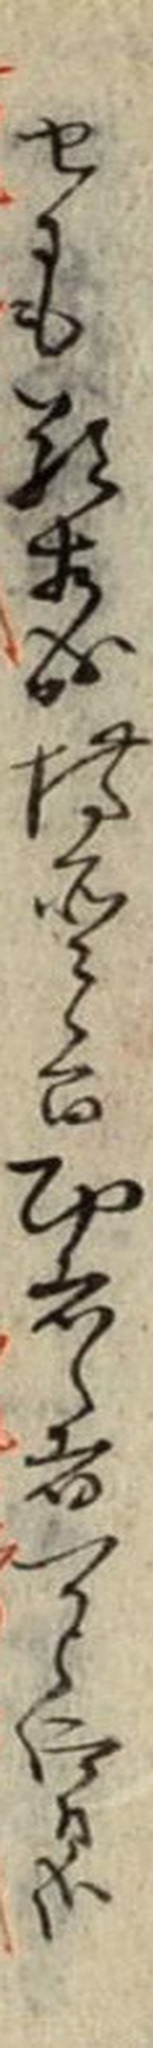せにも難相成場所に候間功者之者可被仰付候哉
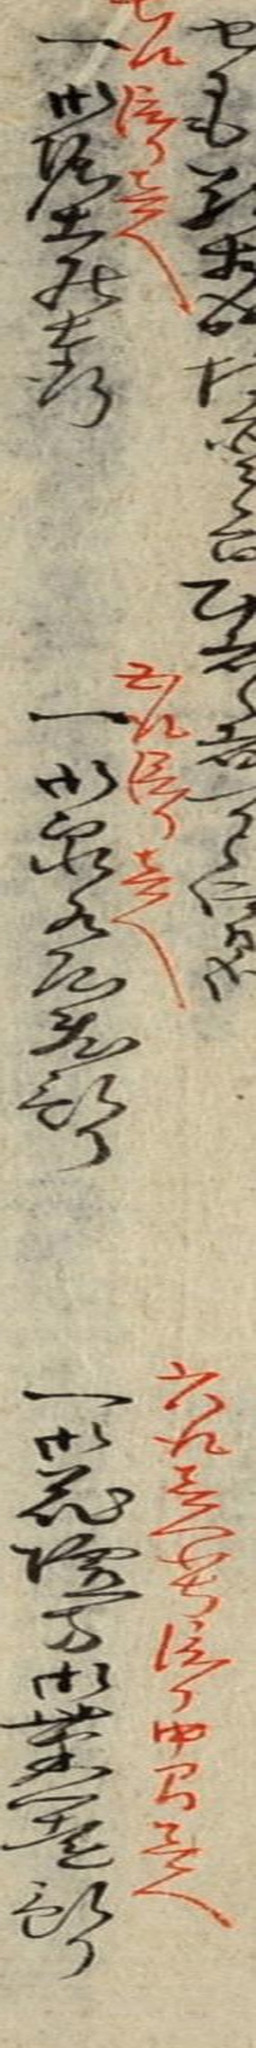一御堀土居奉行一御泉水屋敷預り一御花壇方御菜薗預り
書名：御用并被仰出之部
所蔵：福井県文書館 Fukui Prefectural Archives
